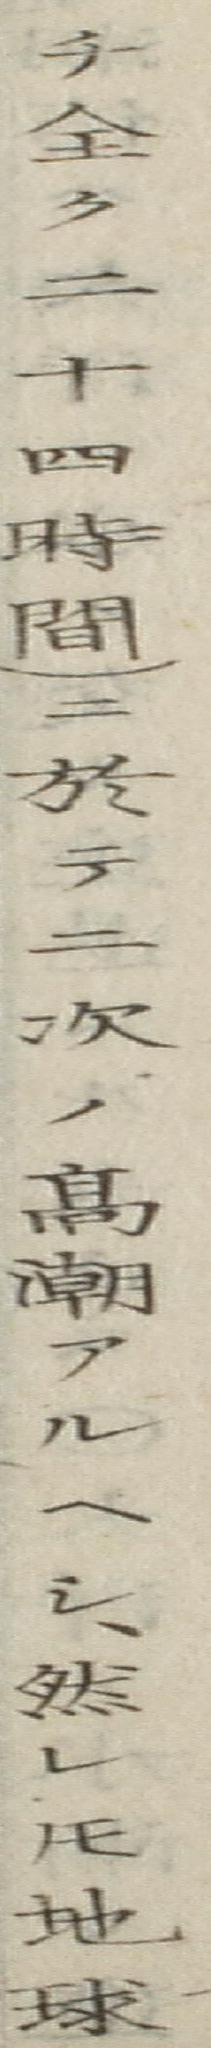チ全ク二十四時間）ニ於テ二次ノ高潮アルヘシ、然レトモ地球
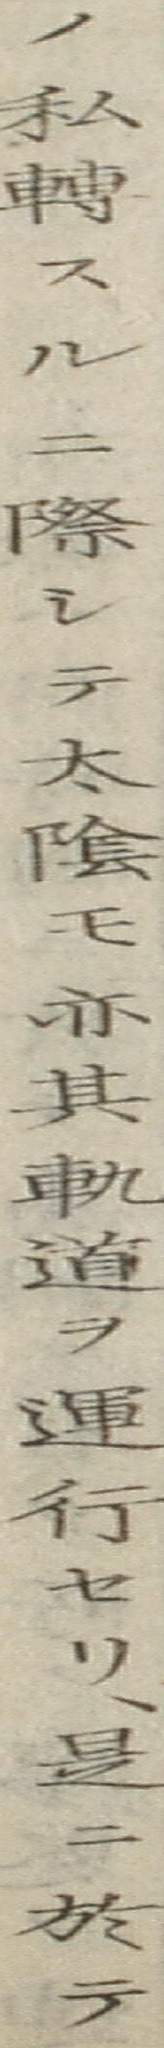ノ私転スルニ際シテ太陰モ亦其軌道ヲ運行セリ、是ニ於テ
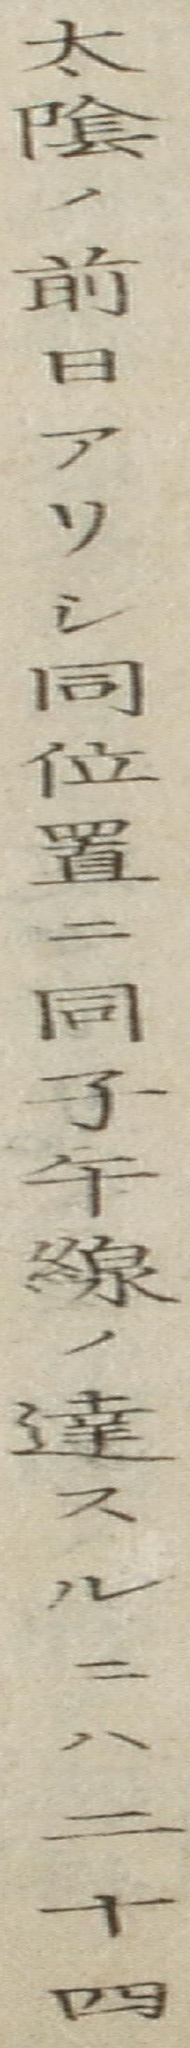太陰ノ前日アリシ同位置ニ同子午線ノ達スルニハ二十四
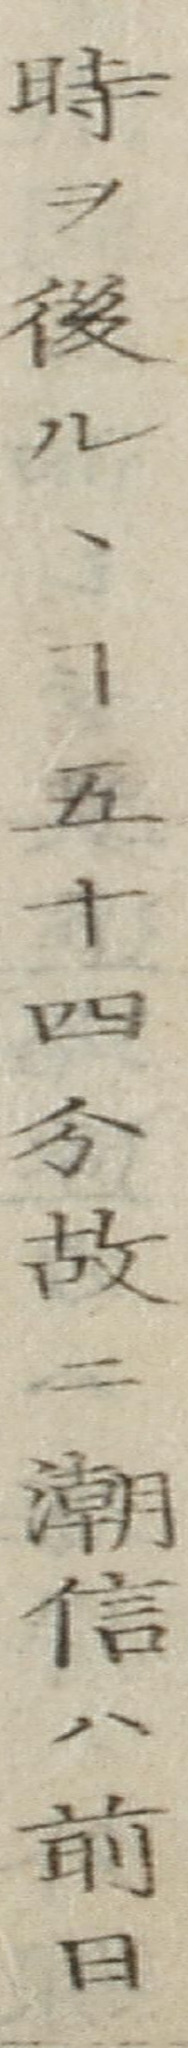時ヲ後ルヽヿ五十四分後故ニ潮信ハ前日
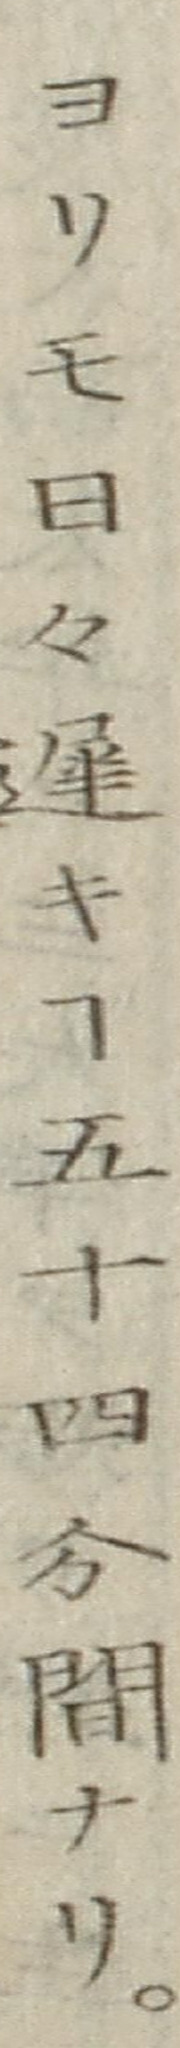ヨリモ日々遅キヿ五十四分間ナリ。
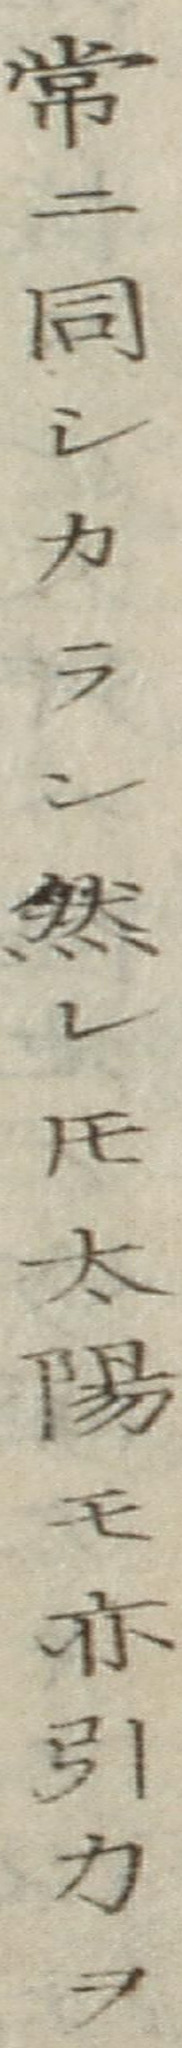常ニ同シカラン然レトモ太陽モ亦引力ヲ
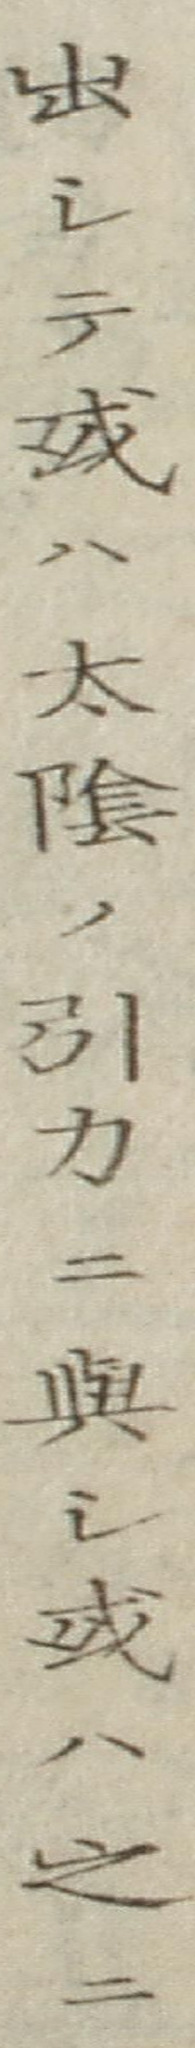出シテ或ハ太陰ノ引力ニ與シ或ハ之ニ
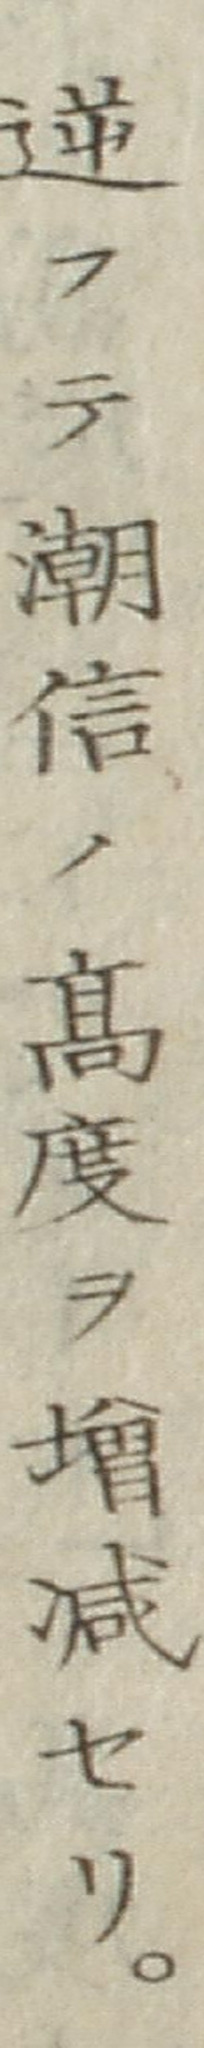逆フテ潮信ノ高度ヲ増減セリ。
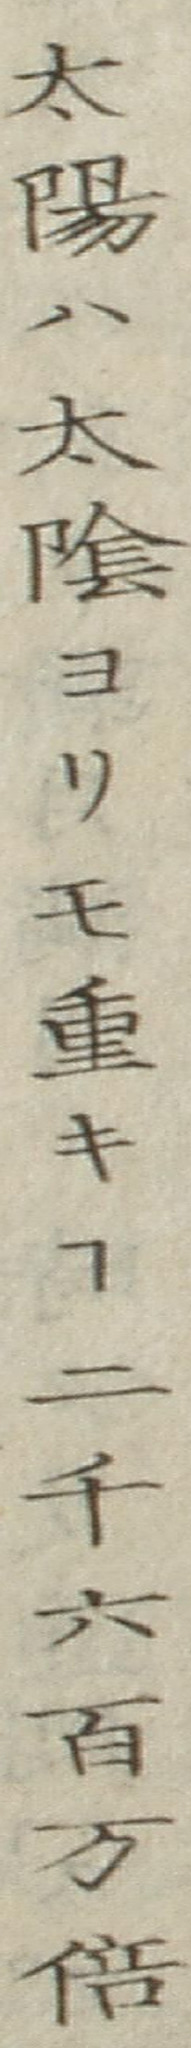太陽ハ太陰ヨリモ重キヿ二千六百万倍
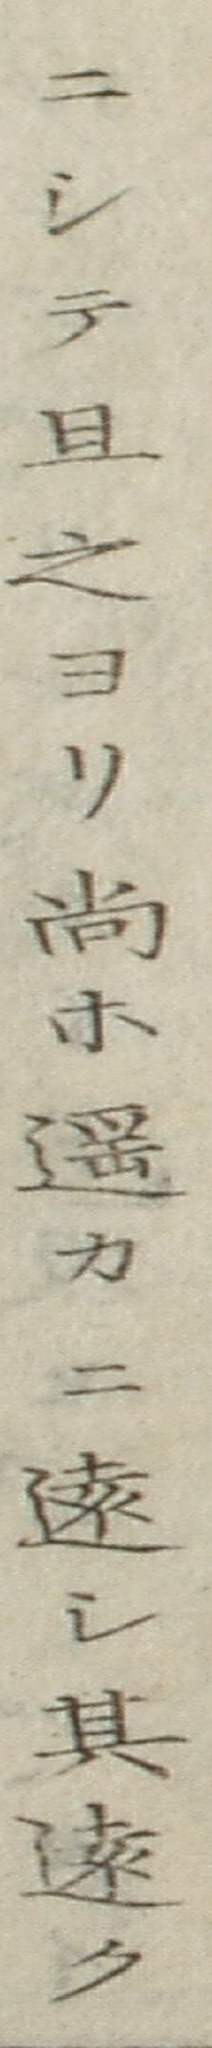ニシテ且之ヨリ尚ホ遥カニ遠シ其遠ク
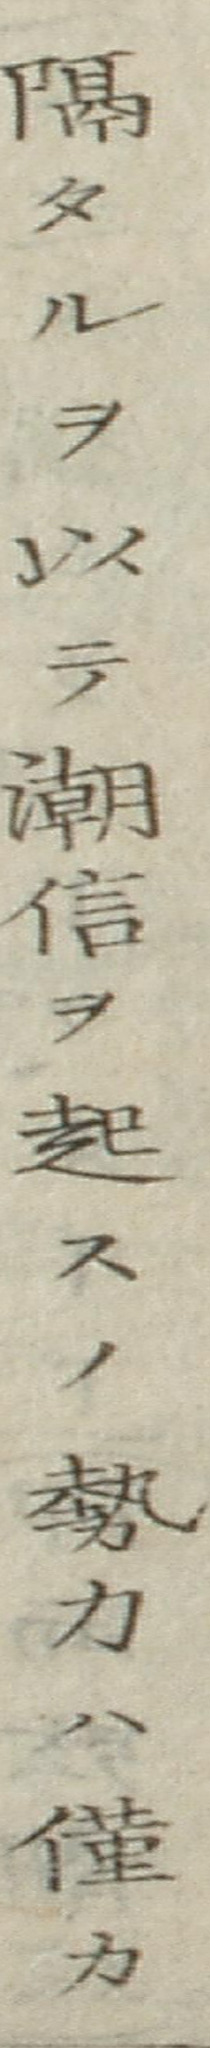隔タルヲ以テ潮信ヲ起スノ勢力ハ僅カ
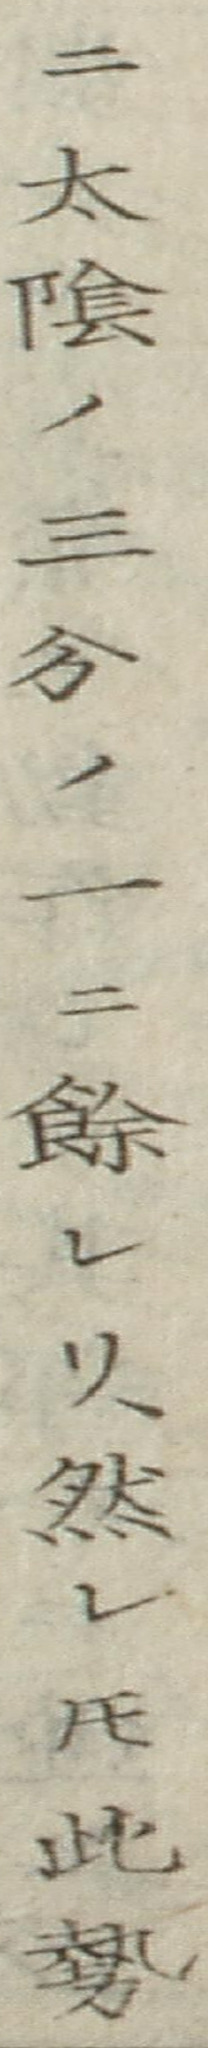ニ太陰ノ三分ノ一ニ余レリ、然レトモ此勢
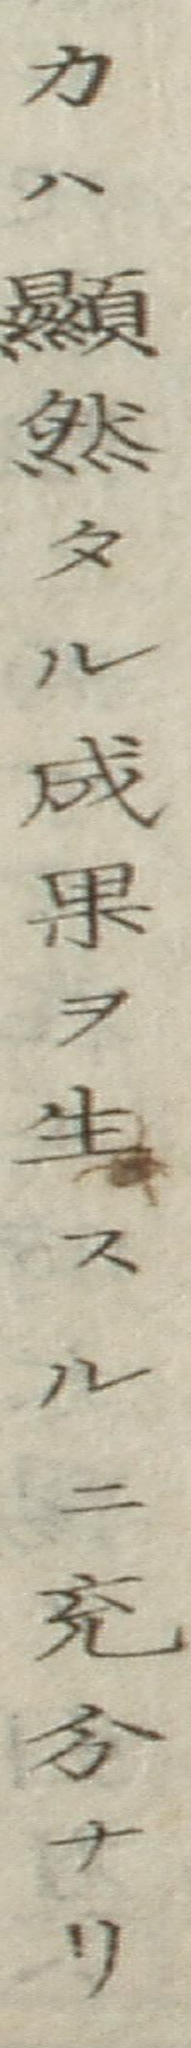力ハ顕然タル成果ヲ生スルニ充分ナリ
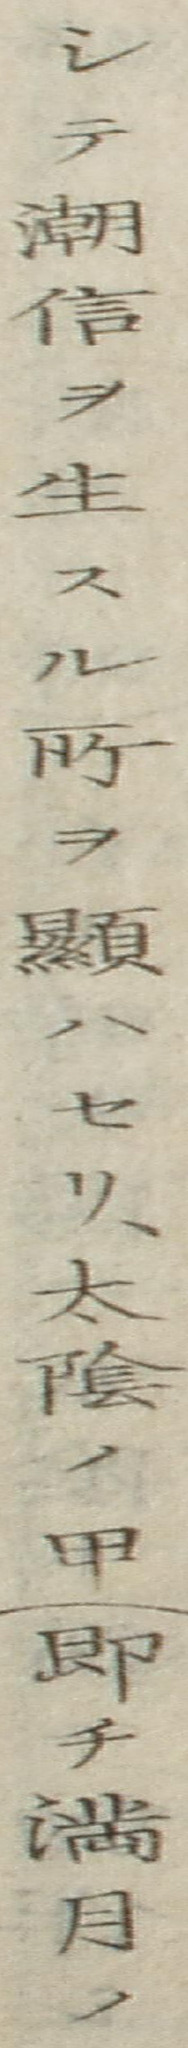シテ潮信ヲ生スル所ヲ顕ハセリ、太陰ノ甲（即チ満月ノ

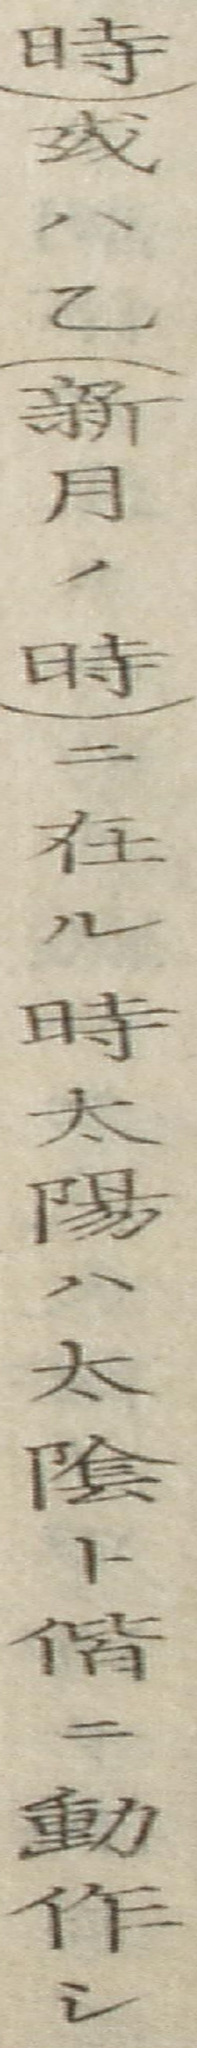時）或ハ乙ニ在ル時太陽ハ太陰ト偕ニ動作シ
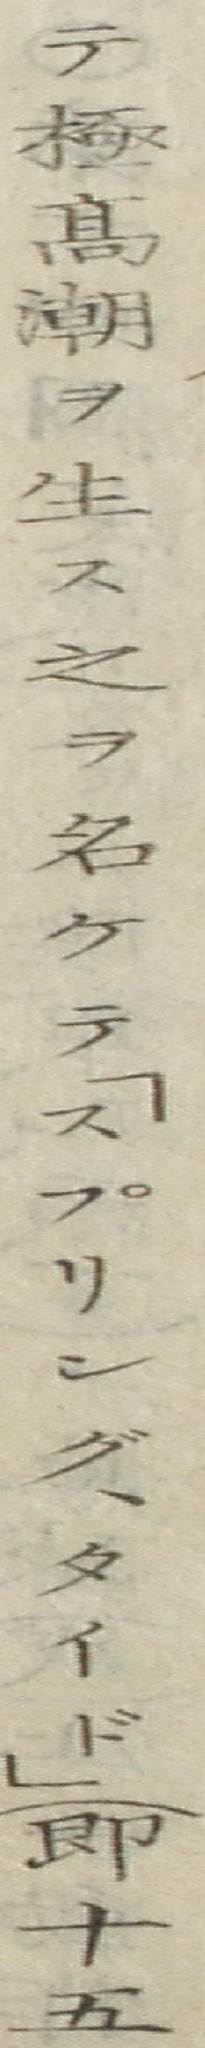テ極高潮ヲ生ス之ヲ名ケテ「スプリング、タイド」（即十五
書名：地形論　巻二
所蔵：東京大学地震研究所図書室 Earthquake Research Institute Library, The University of Tokyo, JAPAN
